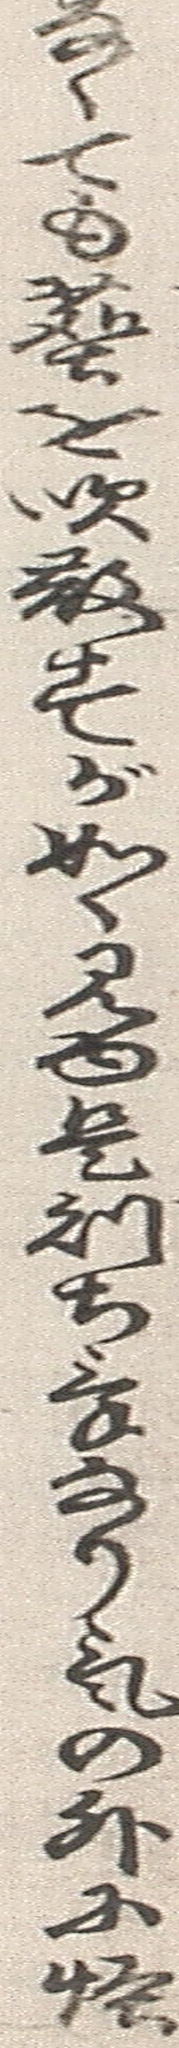なくても塵を吹散すが如く見ゆ是即ち気なり気の外に怪
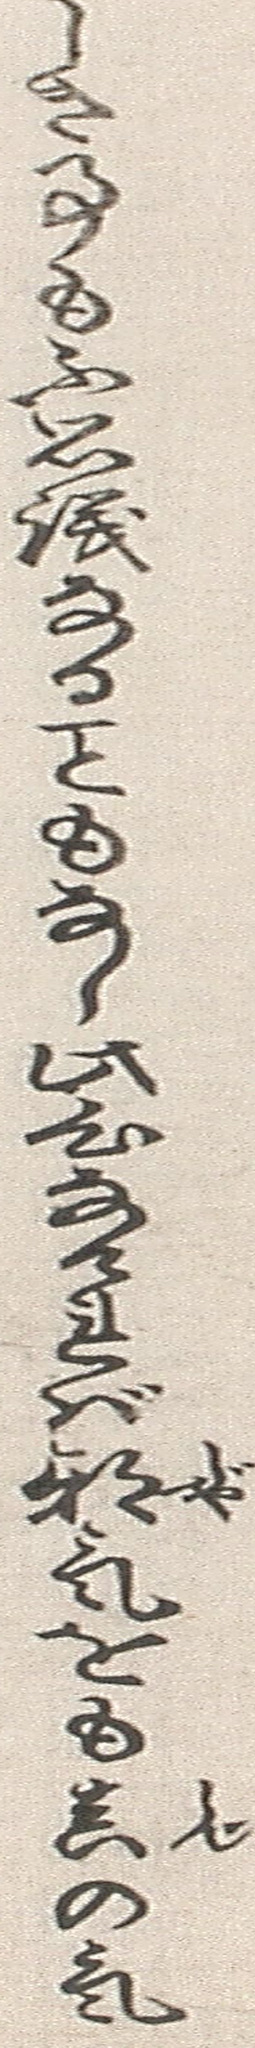しき事も不思議なることもなし此心なけれんバ邪気をも真の気
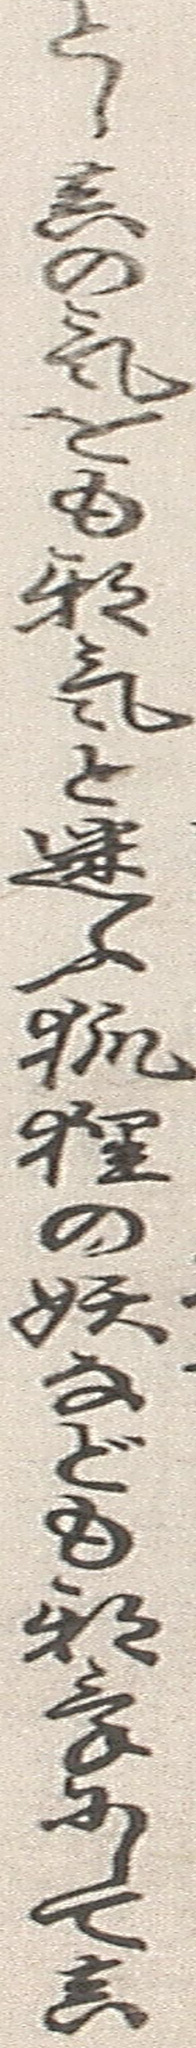とし真の気をも邪気と迷ふ狐狸の妖なども邪気にして真
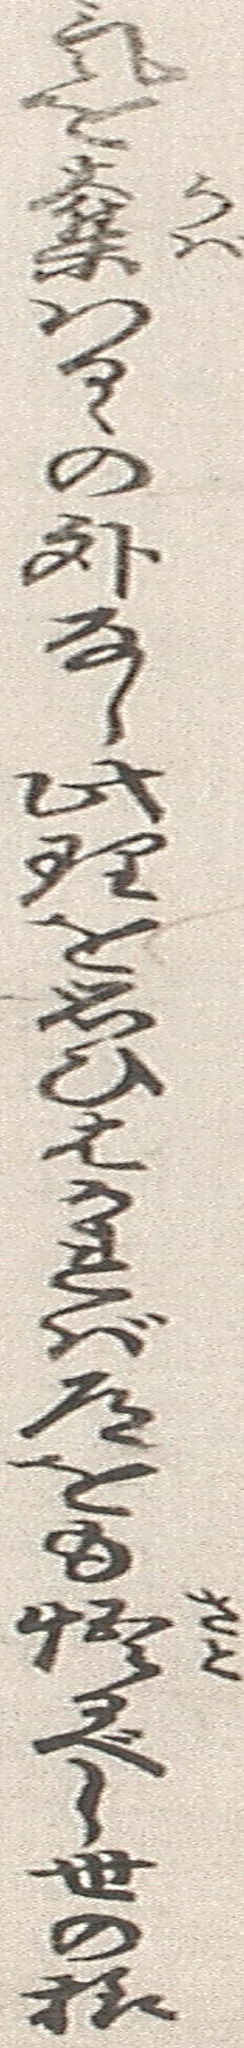気を奪はるゝの外なし此理を思ひはかれバ道をも悟るべし世の様
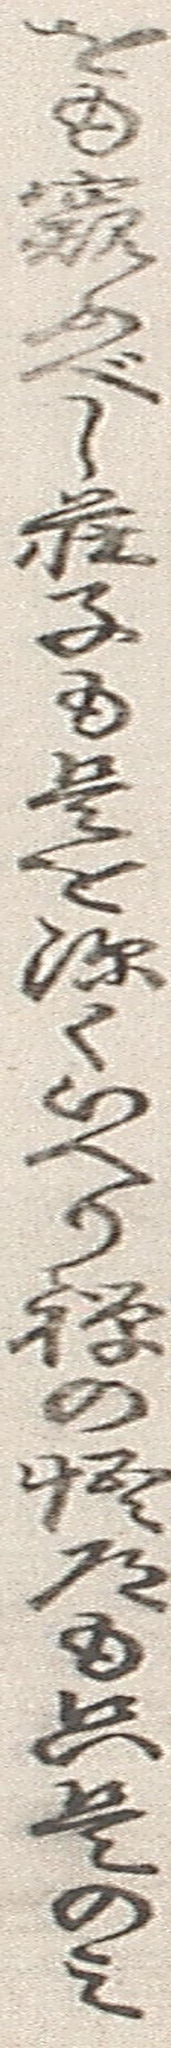をも窺ふべし荘子も是を深くいへり禅の悟道も只是のミ
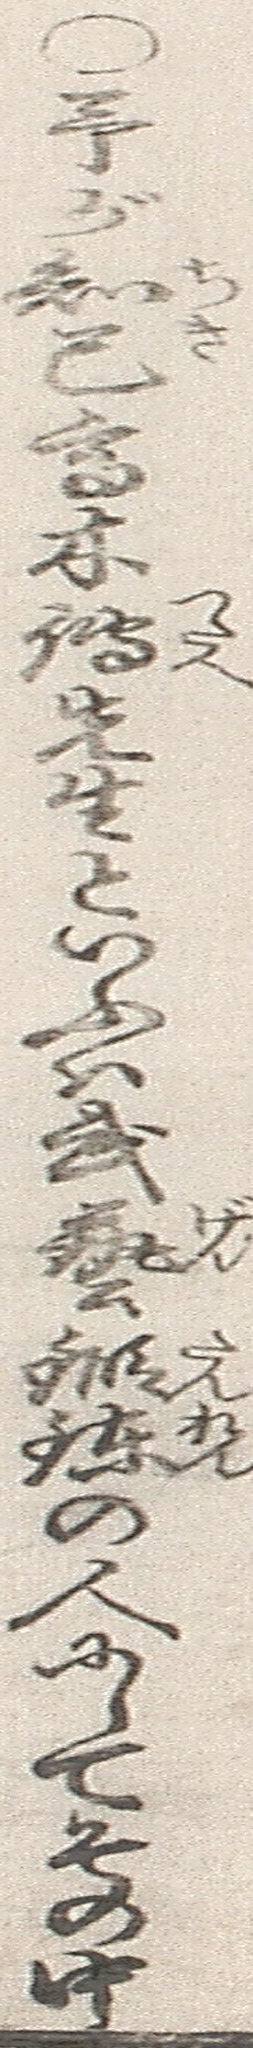◯予が知己高木伝先生といふハ武芸鍛錬の人にてその中
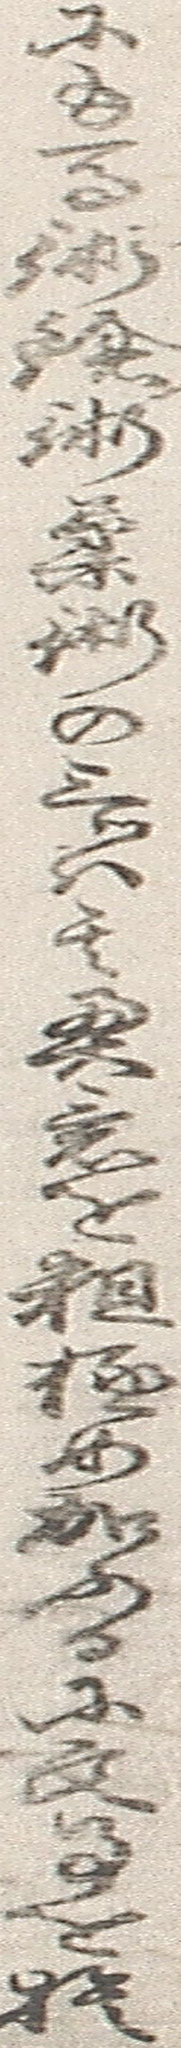にも馬術鎗術柔術の三ッは其奥意を粗極め加ふるに文事を捨
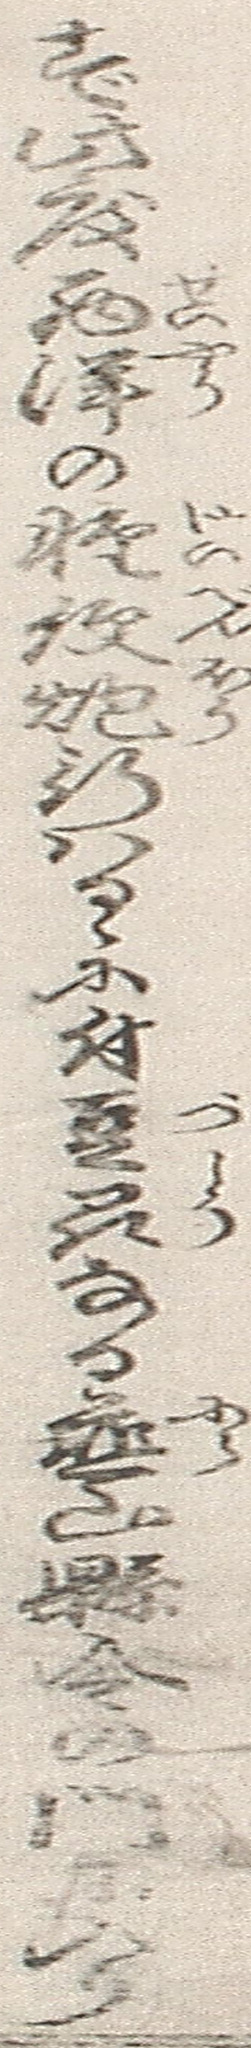ず此度西洋の輕便炮術行ハるゝに付豆洲なる韮山県令の門に入り
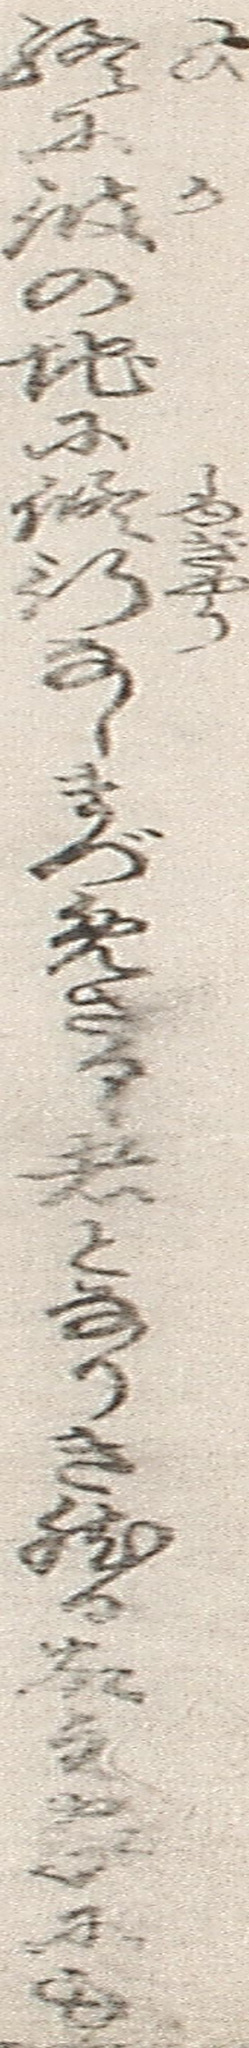終に彼の地に修行なしまづ免さるゝ者となりき然る故主家にも
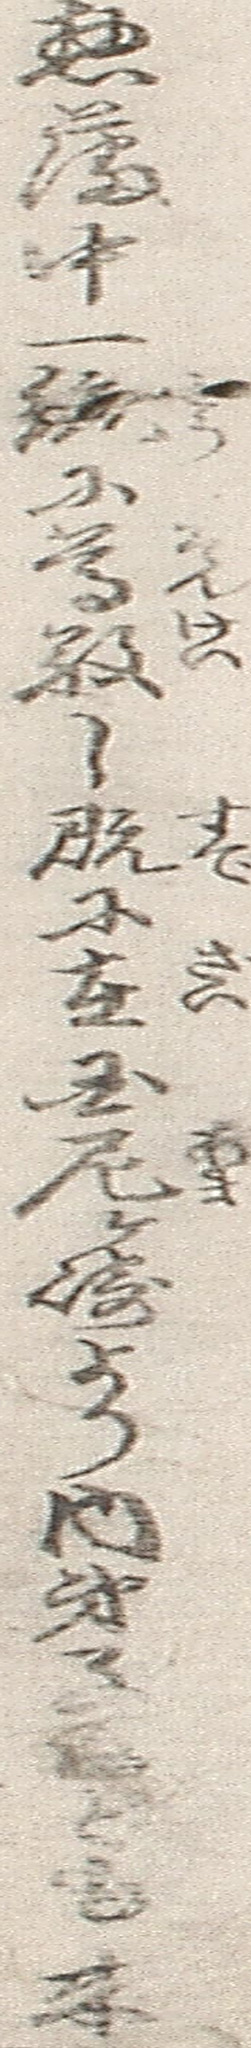惣藩中一統に尊敬し既に在国尼ヶ崎より内弟子なども来
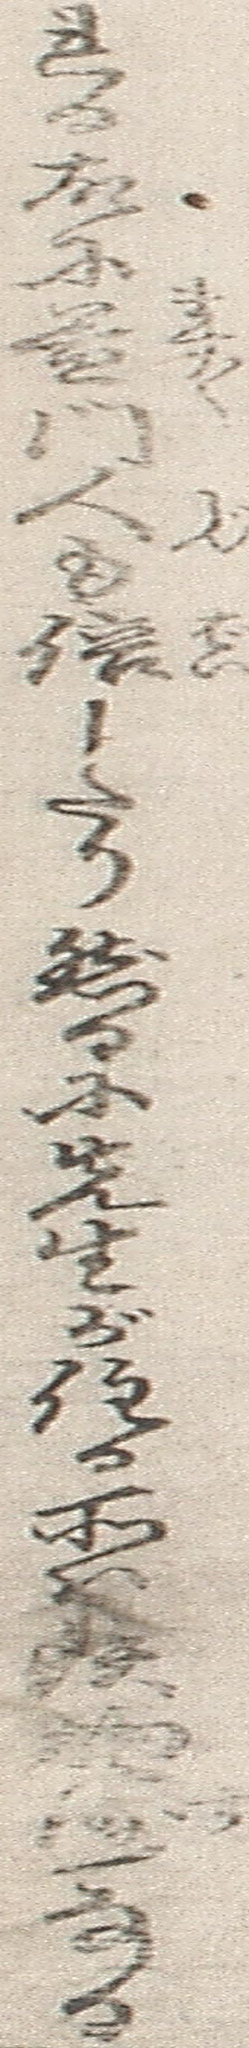れる故に益門人も倍したり然るに先生が住る所ハ鉄炮州なる

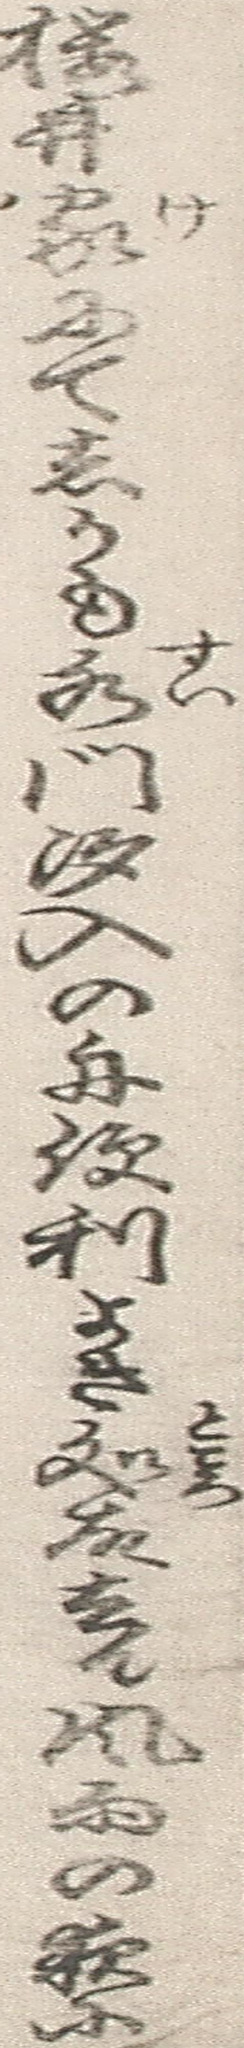桜井家にてしかも水門汐入の舟便利よき処故去ㇽ風雨の夜に
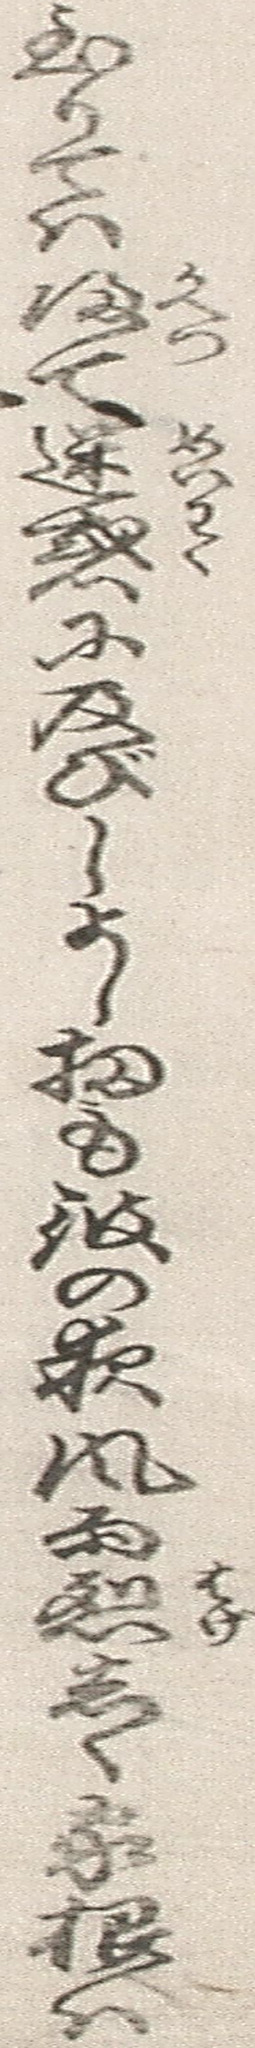至りてハ帰て迷惑に及びしより扨も彼の夜風雨烈しく家根ハ
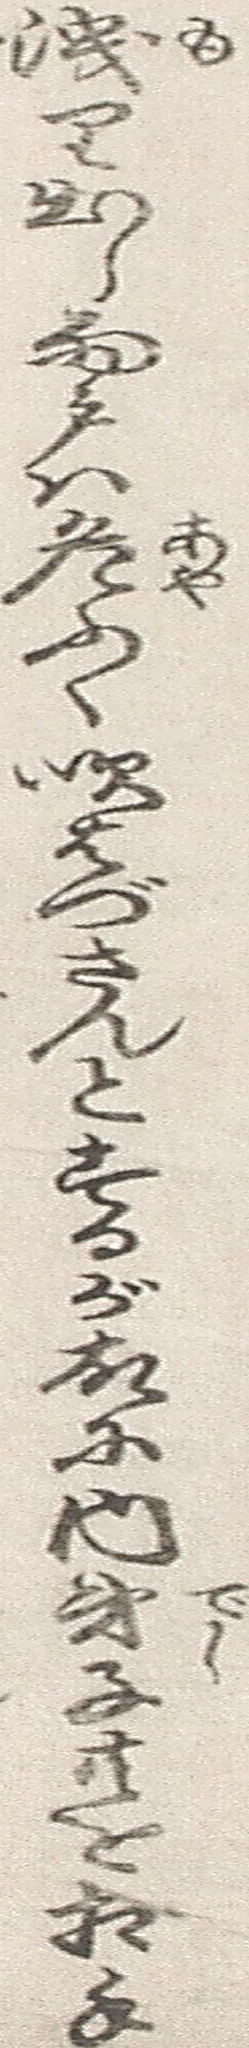漏り出し雨戸ハ危ふく吹はづさんとするが故に内弟子共を相手
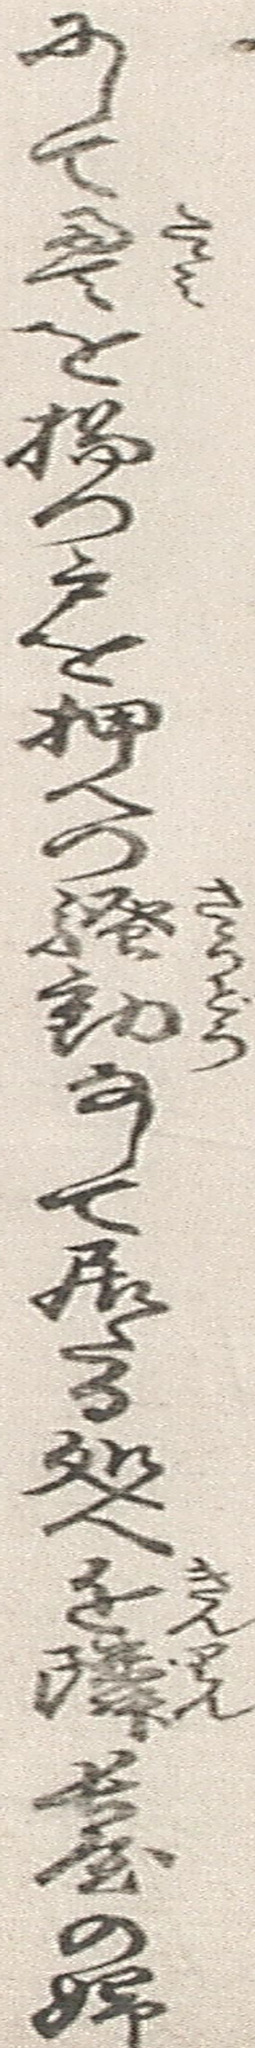にて畳を揚つ戸を押への騒動なして居る処へ近隣長屋の婦
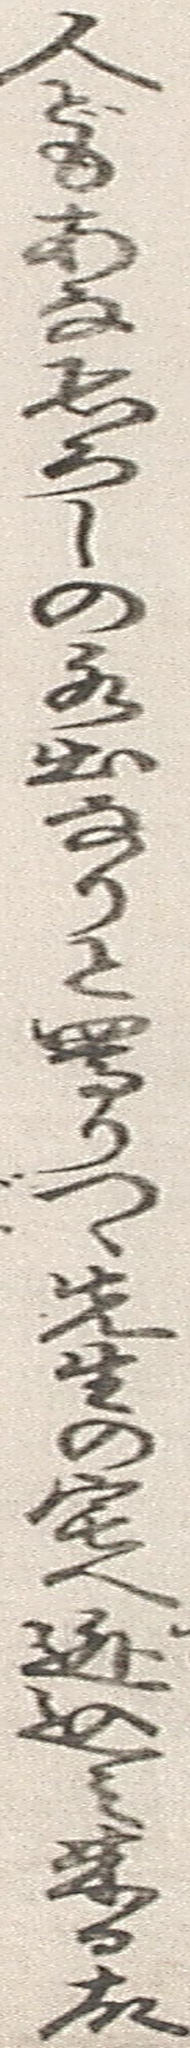人どもあな恐ろしの水出なりと罵りつゝ先生の宅へ逃込ミ来る故
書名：安政風聞集　上中下　全
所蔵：東京大学地震研究所図書室 Earthquake Research Institute Library, The University of Tokyo, JAPAN
